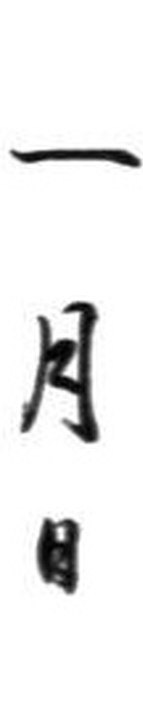一月日
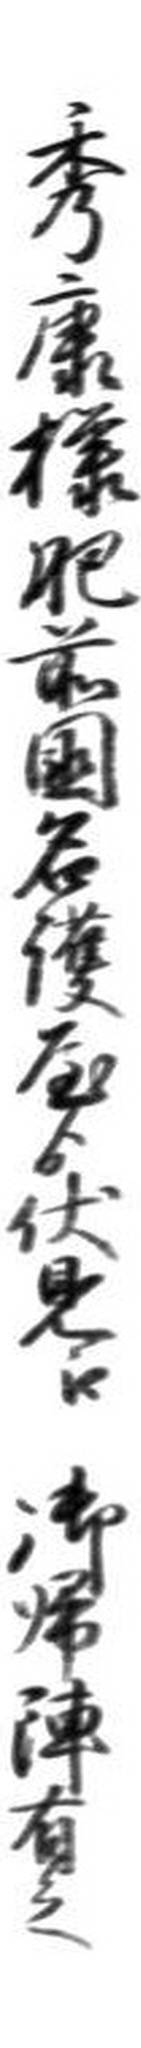秀康様肥前国名護屋ゟ伏見江御帰陣有之
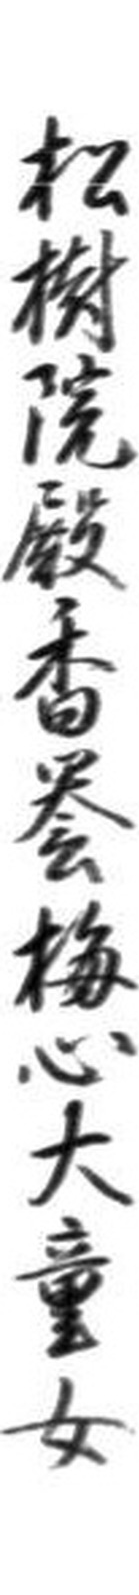松樹院殿香誉梅心大童女
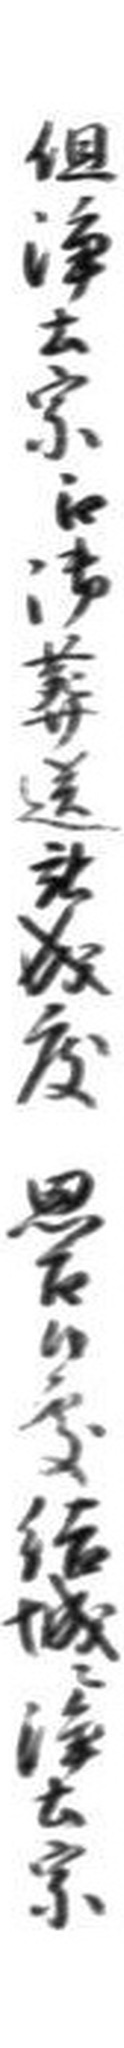但浄土宗江御葬送被成度思召候処結城ニ浄土宗
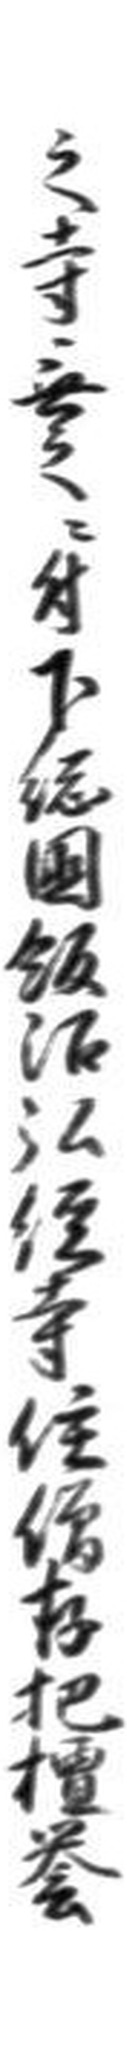之寺無之ニ付下総国飯沼弘経寺住僧存把檀誉

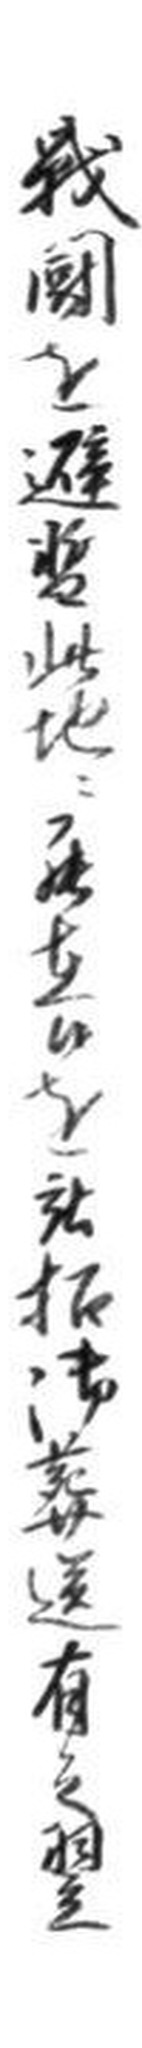戦闘を避暫此地ニ罷在候を被招御葬送有之翌
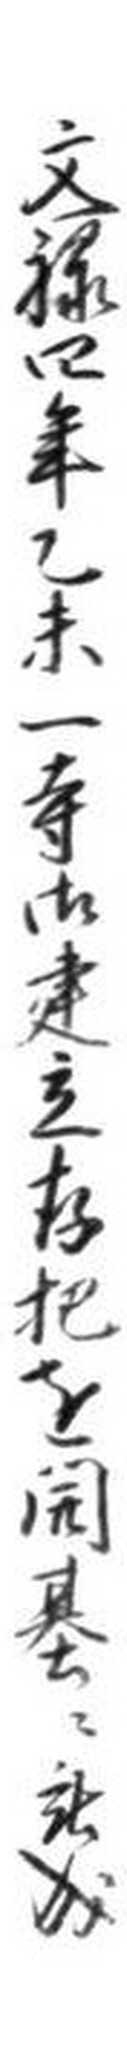文禄四年乙未一寺御建立存把を開基ニ被成
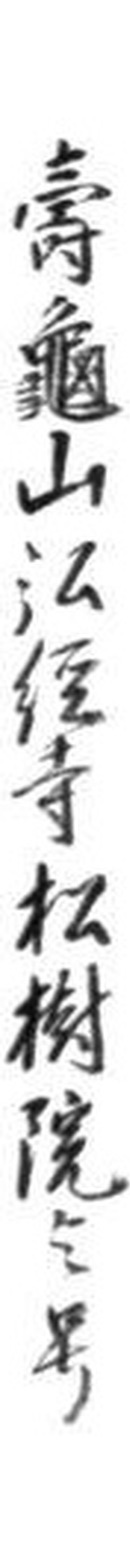壽亀山弘経寺松樹院与号
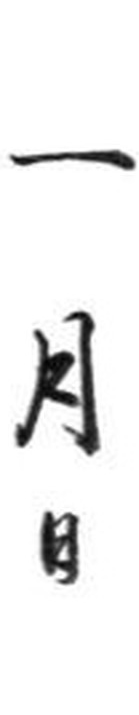一月日
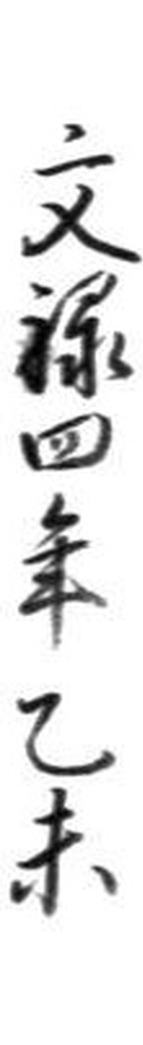文禄四乙未
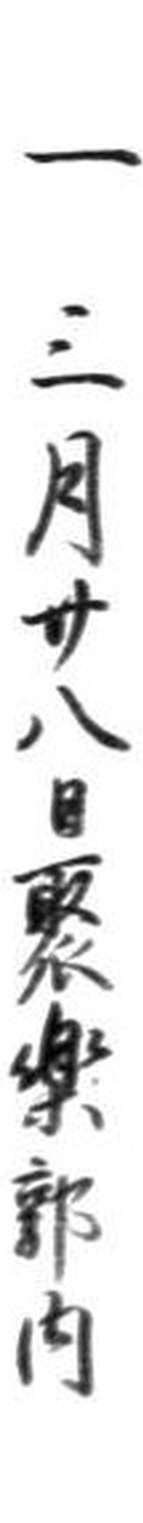一三月廿八日聚楽郭内
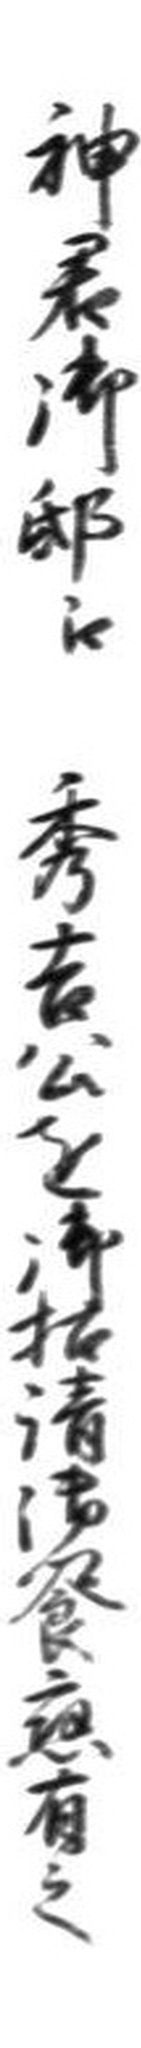神君御邸江秀吉公を御招請御饗応有之
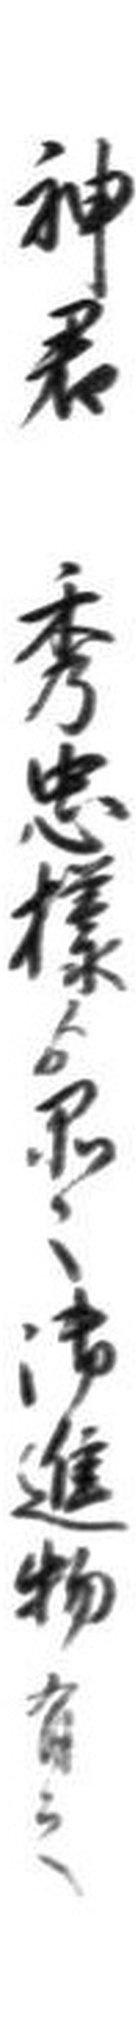神君秀忠様ゟ品々御進物有之
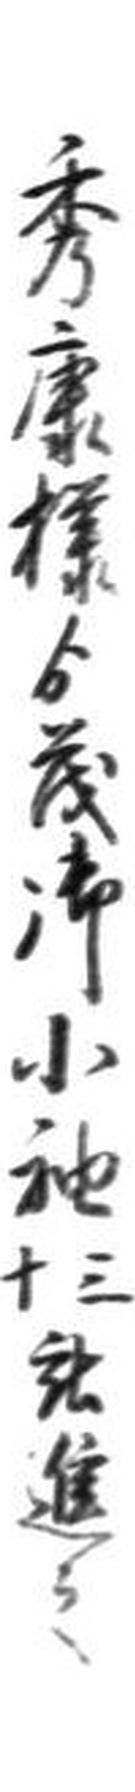秀康様ゟ茂小袖三十被進之
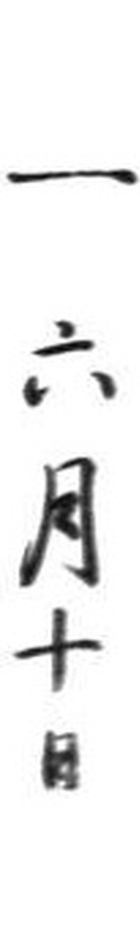一六月十日

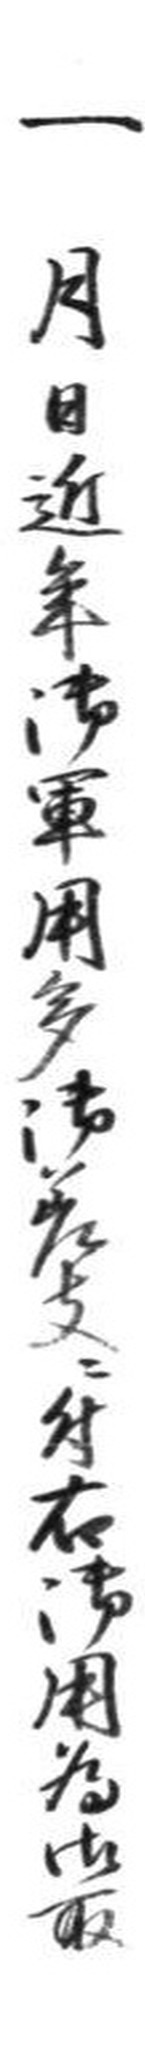一月日近年御軍用多御差支ニ付右御用為御取
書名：家譜 一 秀康公 従天正二年到慶長十二年
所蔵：福井県文書館 Fukui Prefectural Archives
